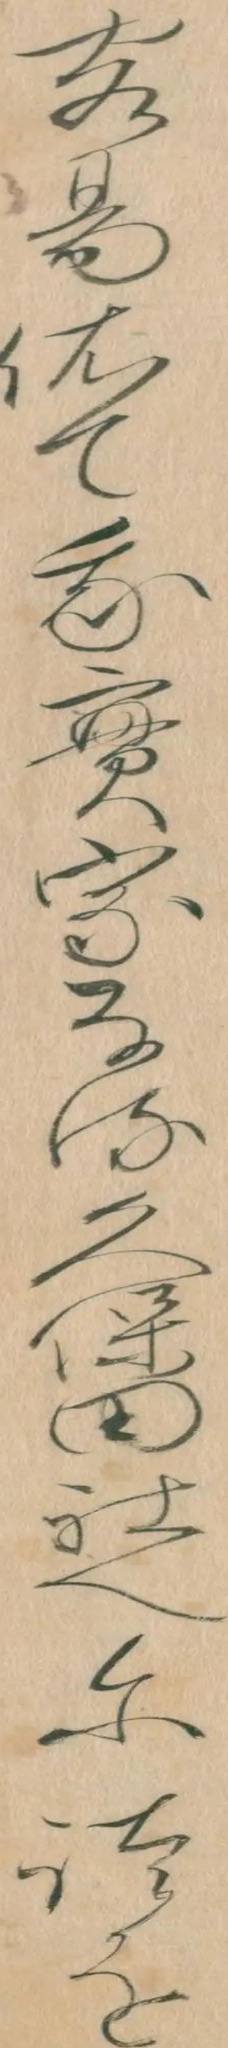容易依て我實家なる久保田社へ参詣を
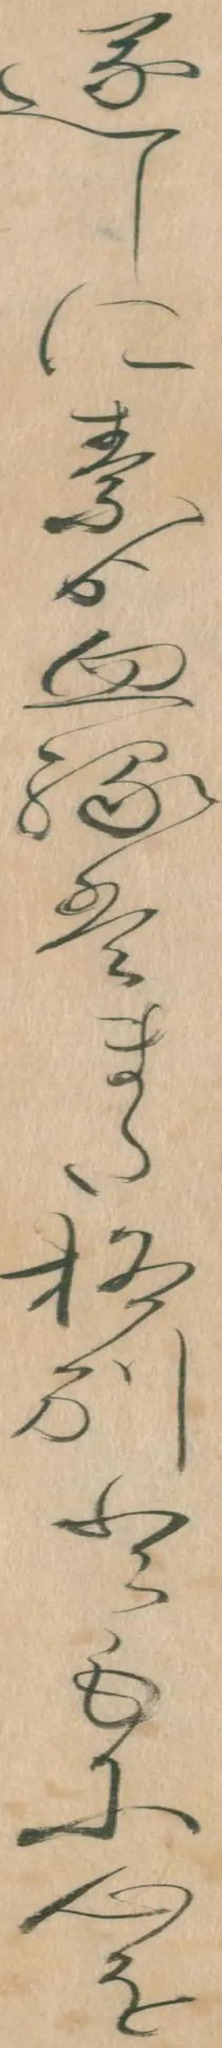遂しに素ゟ血縁はまた格別ともに心を
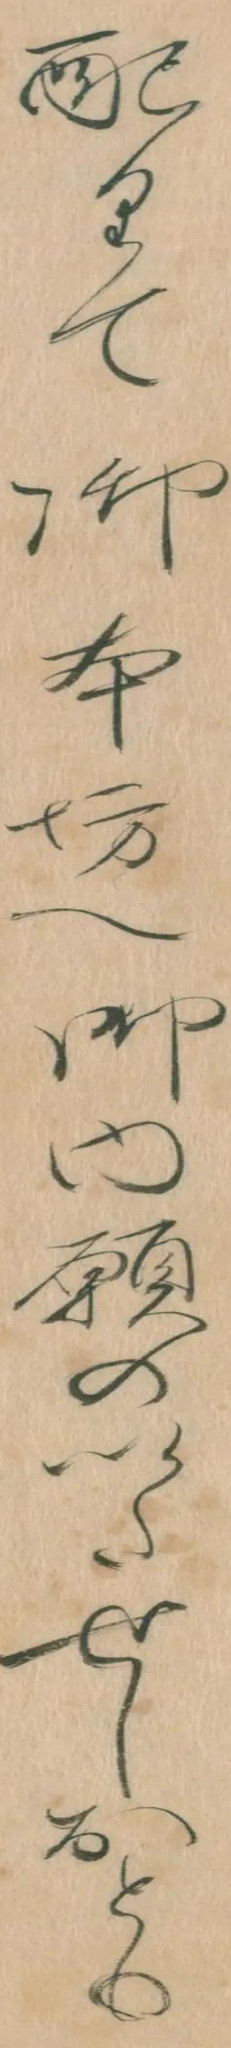配りて御本坊へ御内願のいたせしおとも
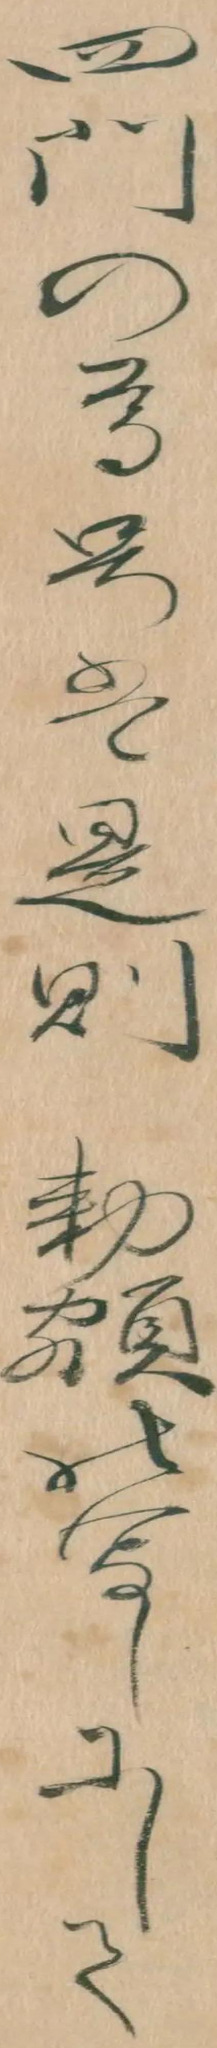四門の尊号は是則勅額の写しにして
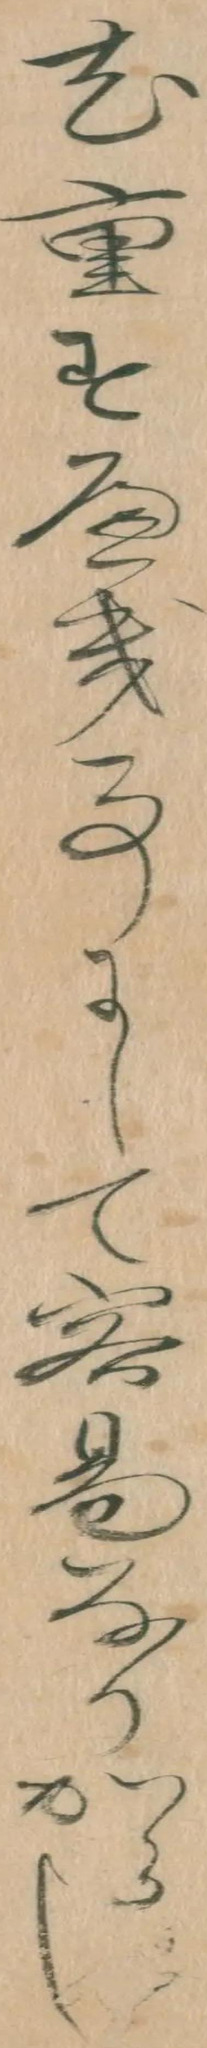尤重すへき事にして容易なりからし
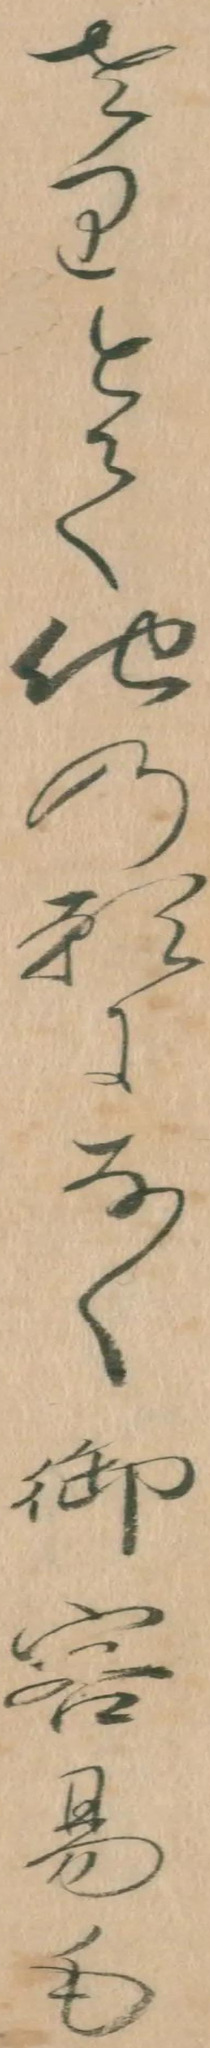さりとて他の願になくご容易も
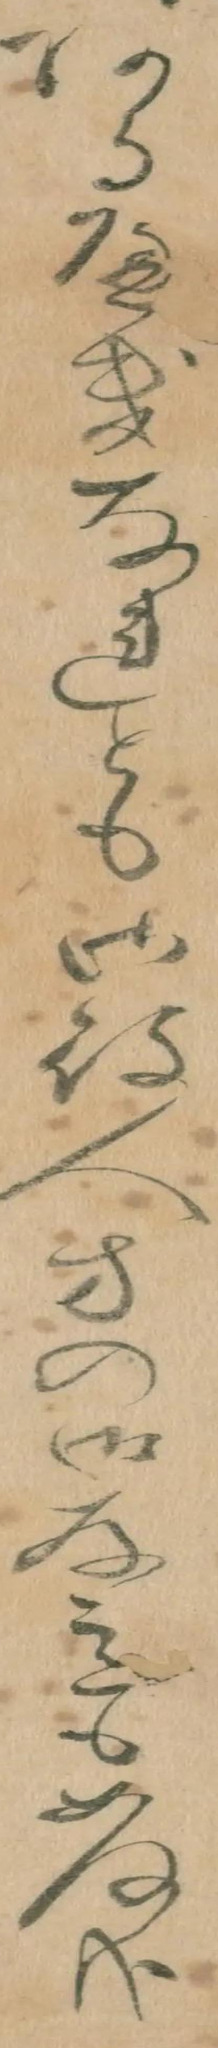あるへきなれとも御役人方の御存意も如何哉
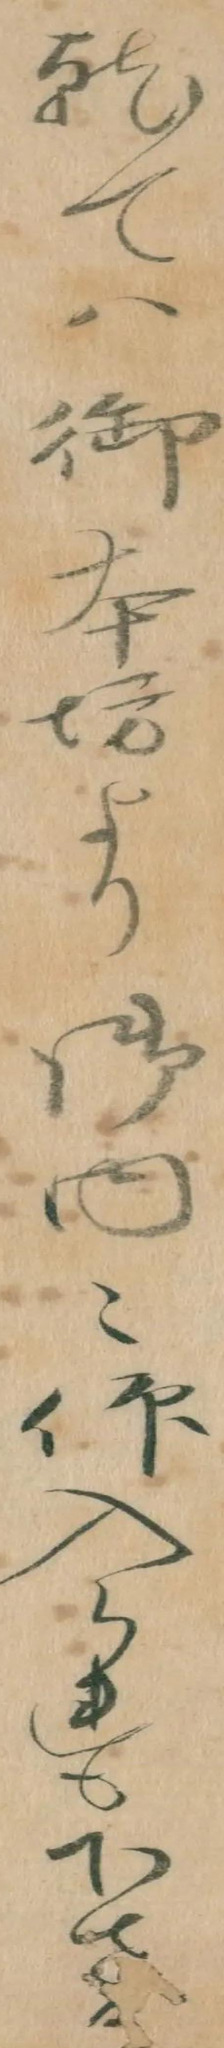就ては御本坊より御内々仰入られも下さる
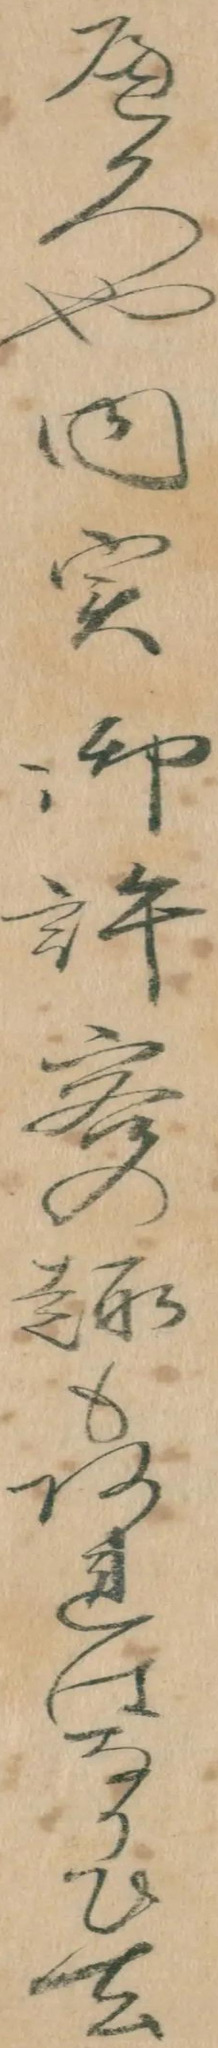へくや内実御許容の趣もあれはなり乍去
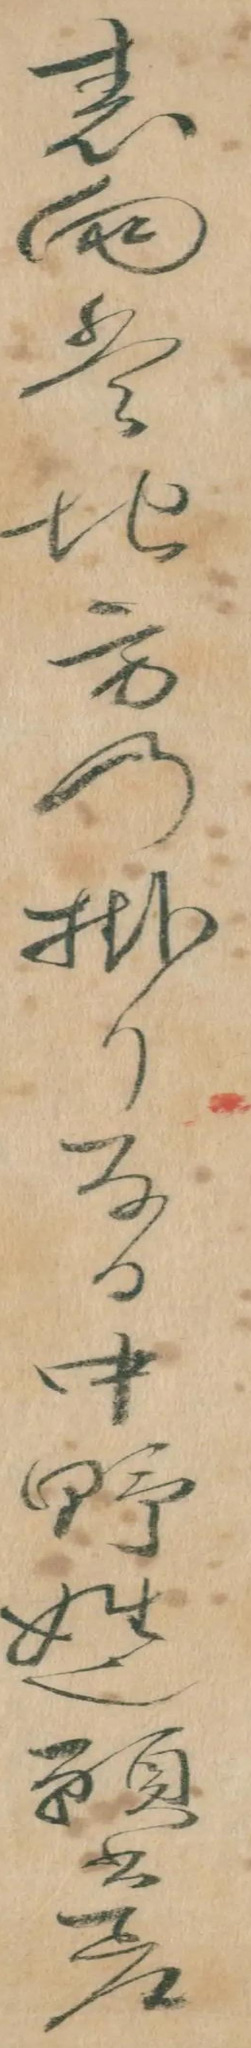表向は地方の掛りなる中野姓へ願出差
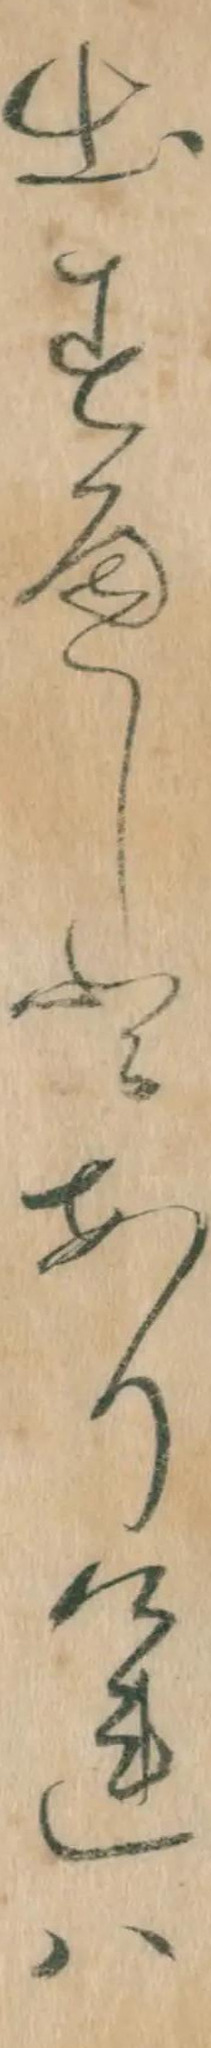出すへしとありけれは
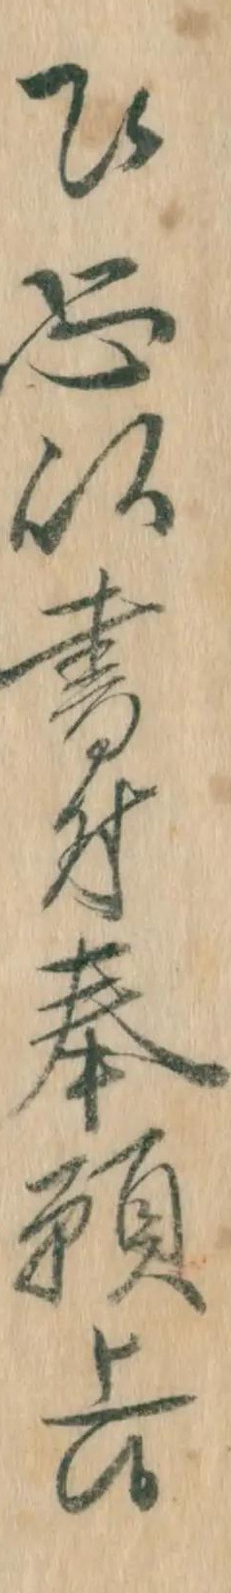乍恐以書付奉願上候
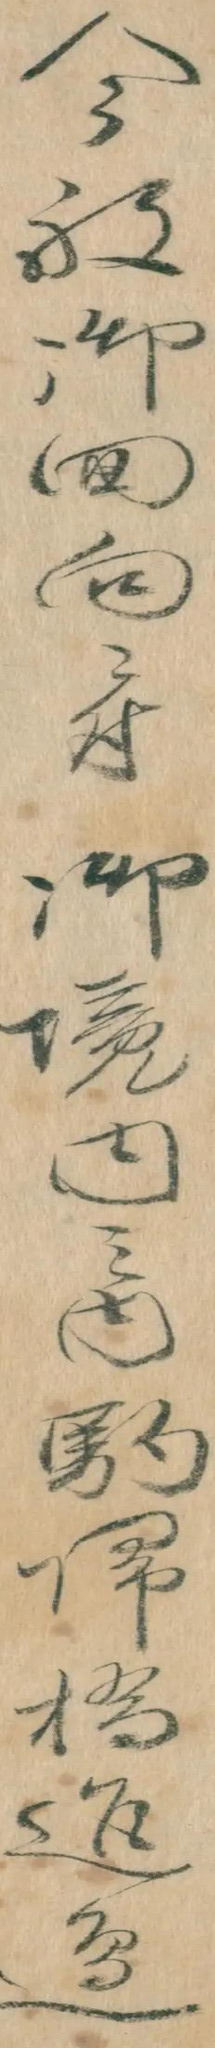今般御回向に付御境内之内駒帰橋近邊
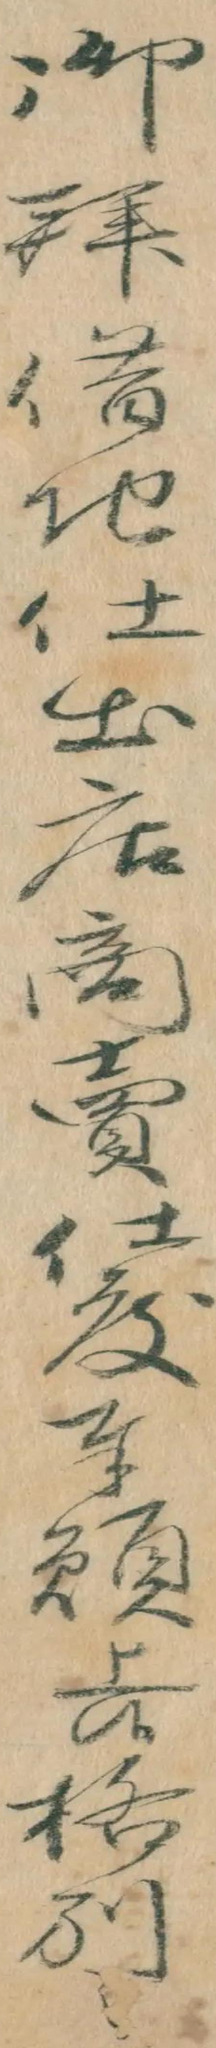御拝借地仕出店商賣支度奉願上候格別之
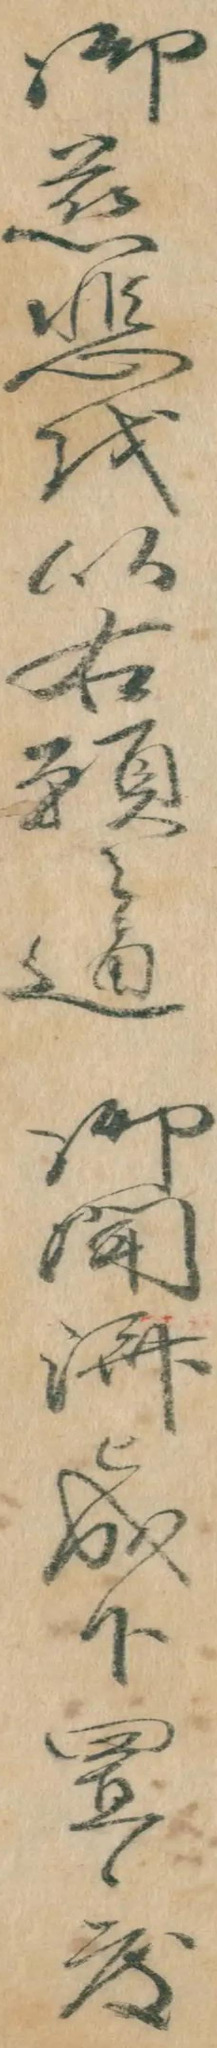御慈悲を以右願之通御聞済被成下置度
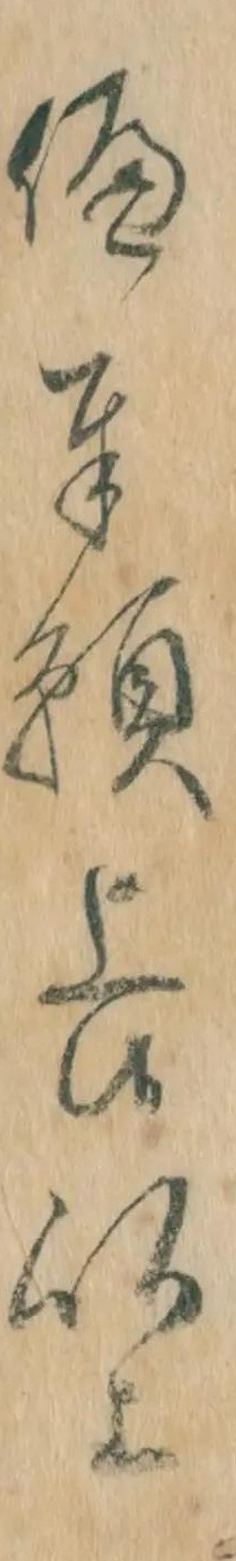偏奉願上候以上
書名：俗語之種. [2]
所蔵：国立国会図書館 National Diet Library, JAPAN
